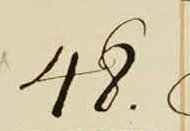48.
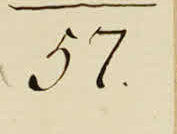57.
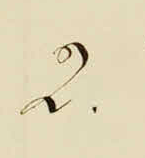2.
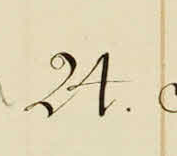24.
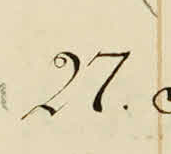27.
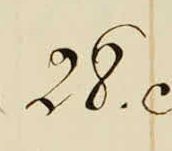28.
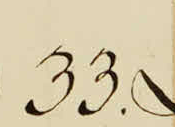33.
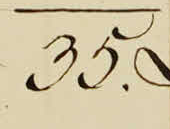35.
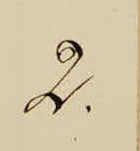2.
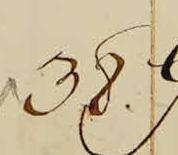38.
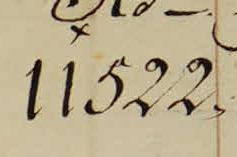11522
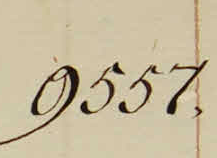9557
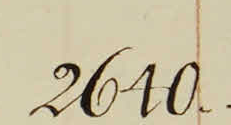2640
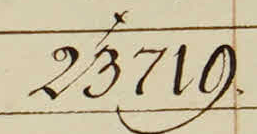23719.
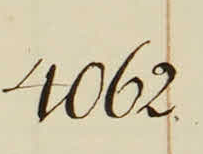4062
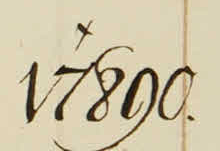17890
